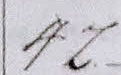42
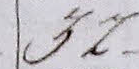32
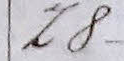28
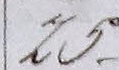25
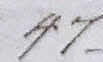47
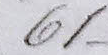61
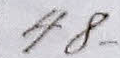48
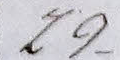29
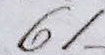61
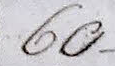60
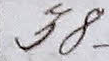38
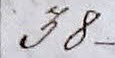38
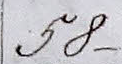58
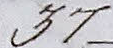37
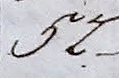52
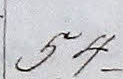54
